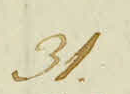31.
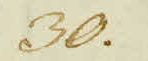30.
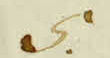5.
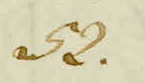52.
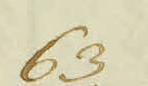63.
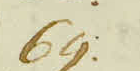69.
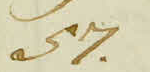57.
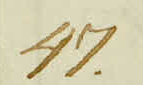47
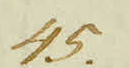45.
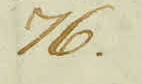76.
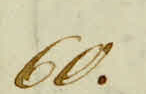60.
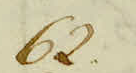62.
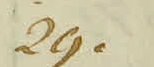29.
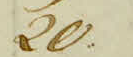20.
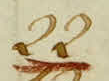22
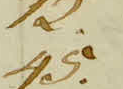45.
